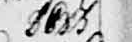8633
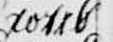20116
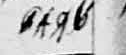6496
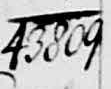43809
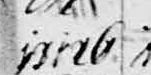13126
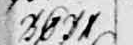3638
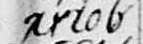21206
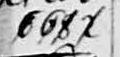6682
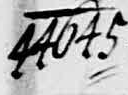44645
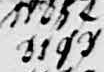3193
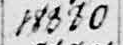18330
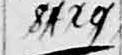8429
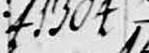41304
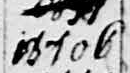13706
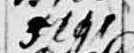5191
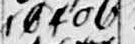16406
